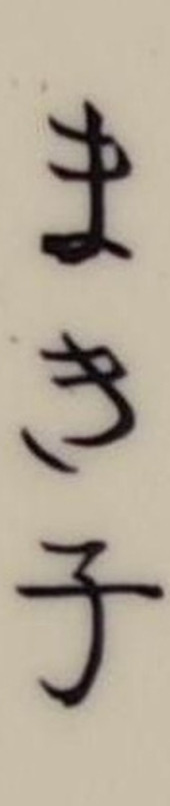まき子
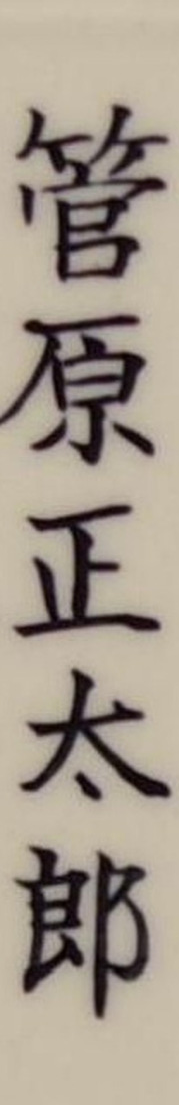菅原正太郎
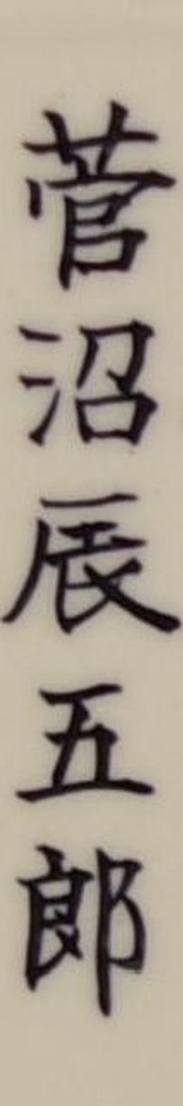菅沼辰五郎

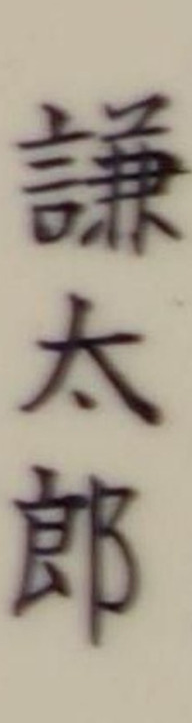謙太郎
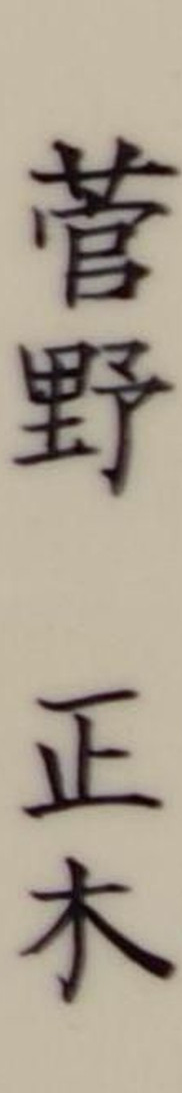菅野正木
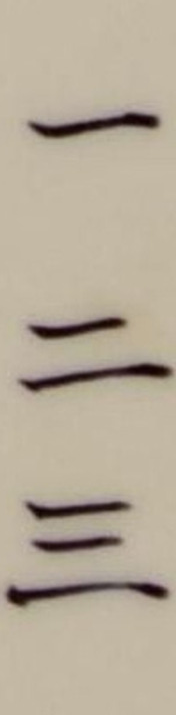一二三
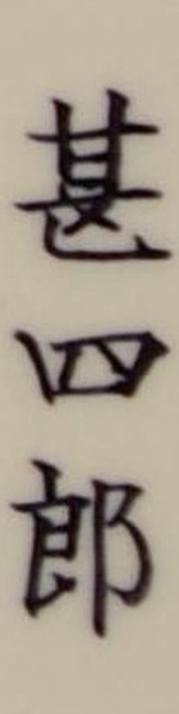甚四郎
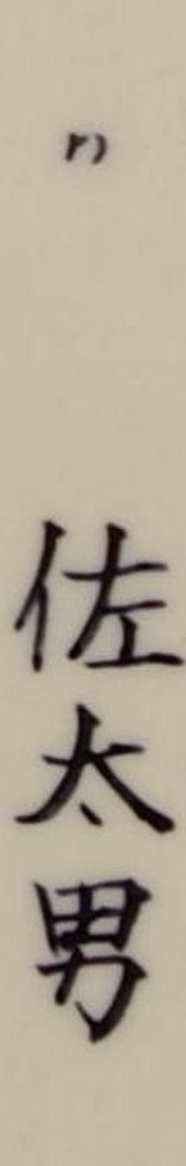佐太男
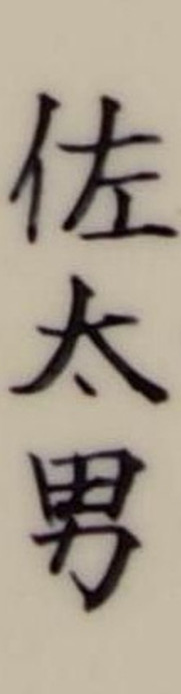佐太男
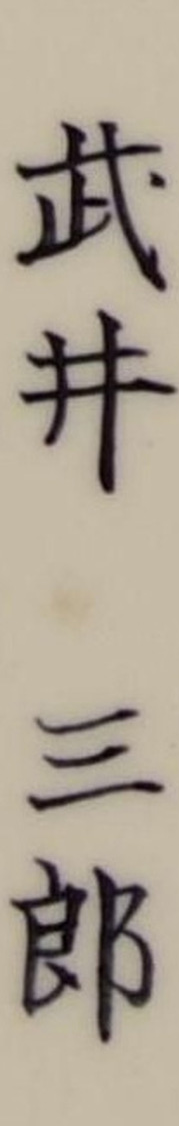武井三郎
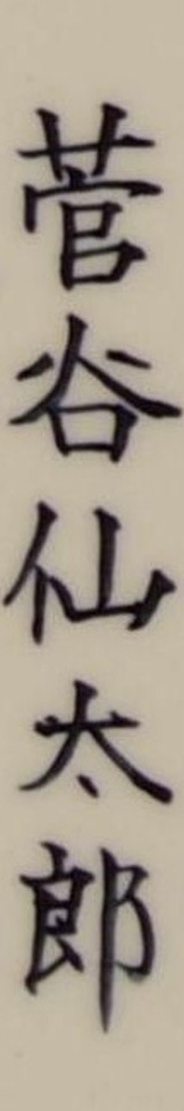菅谷仙太郎
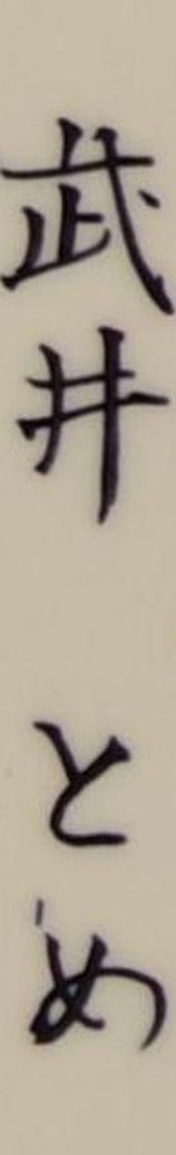武井とめ
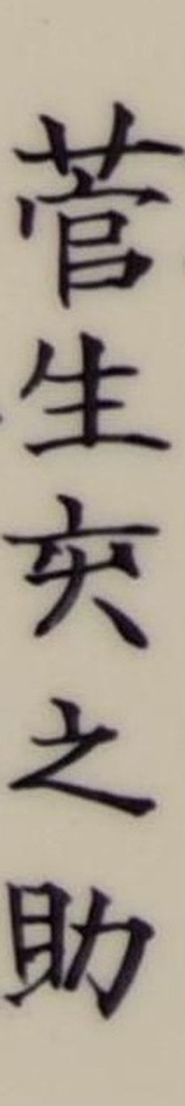菅生亥之助

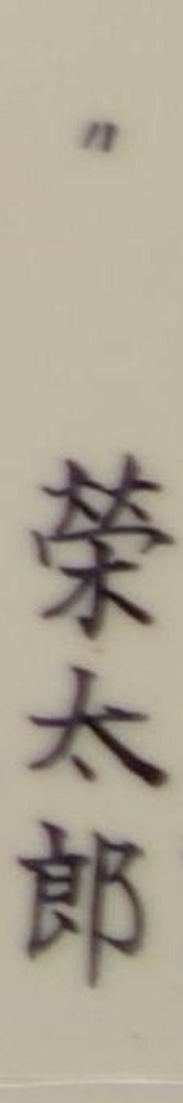榮太郎
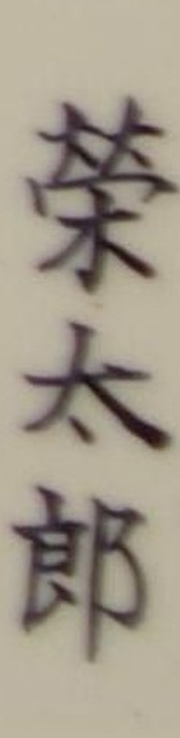榮太郎
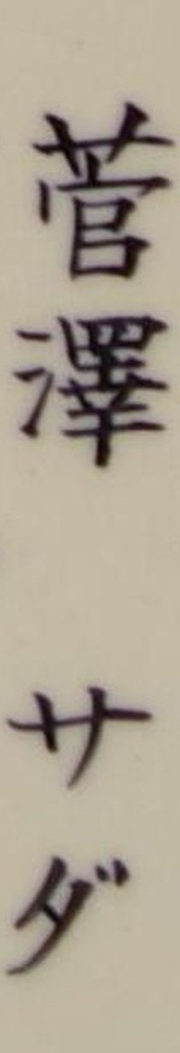菅澤サダ
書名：M~S
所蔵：高野山金剛峯寺
